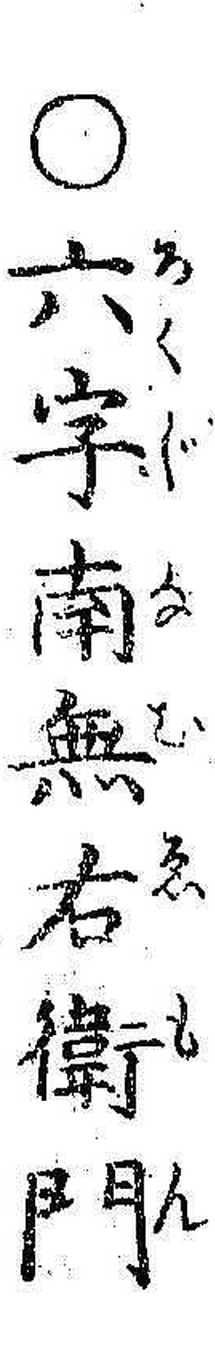○六字南無右衛門
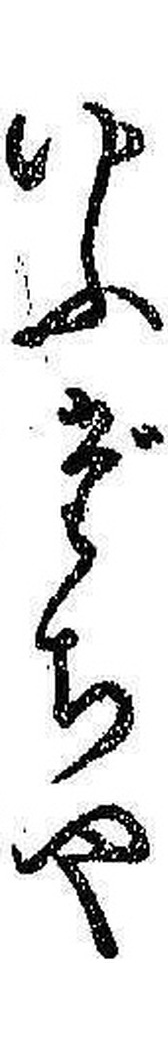ゆふだちや
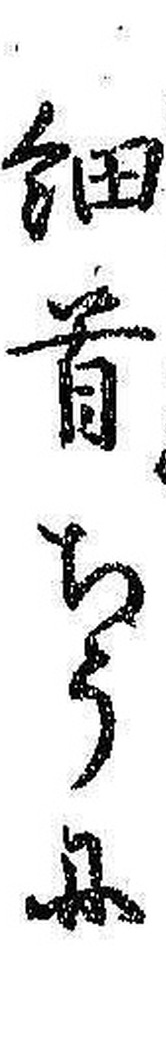細首ちうに
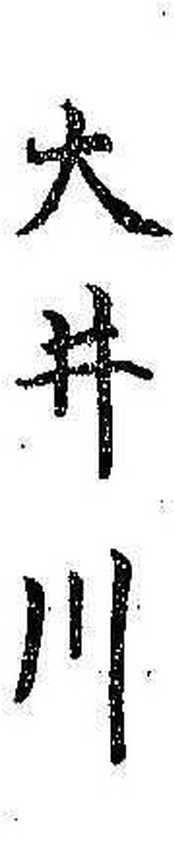大井川
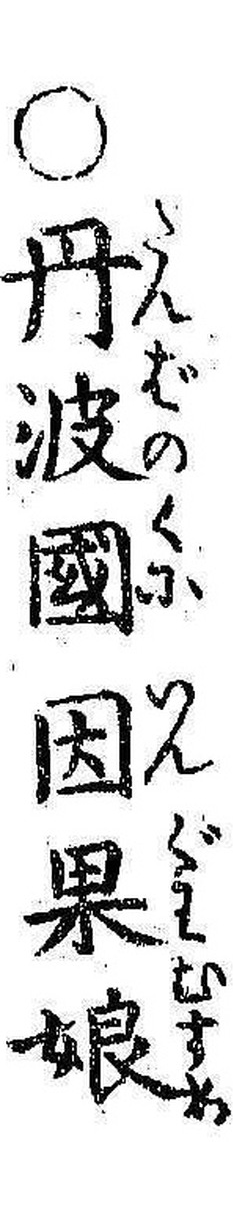○丹波国因果娘
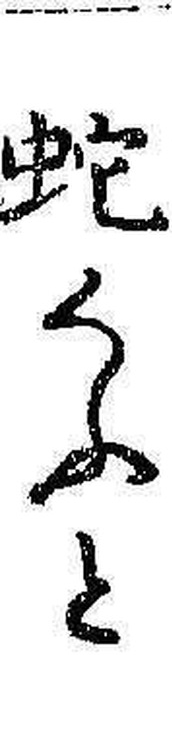蛇くふと
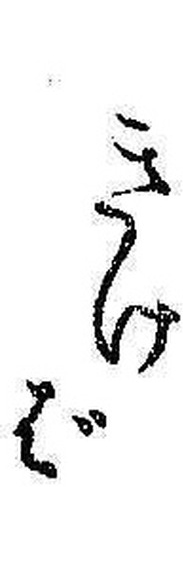きけば
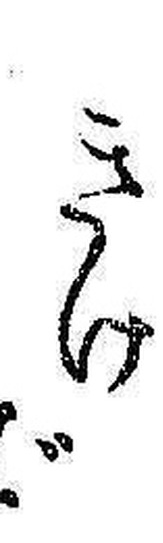きけば
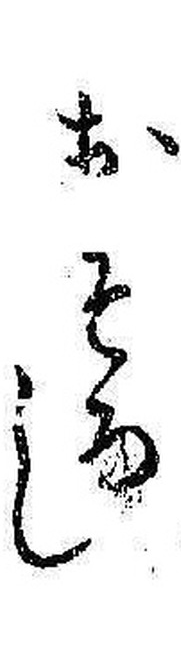おそろし

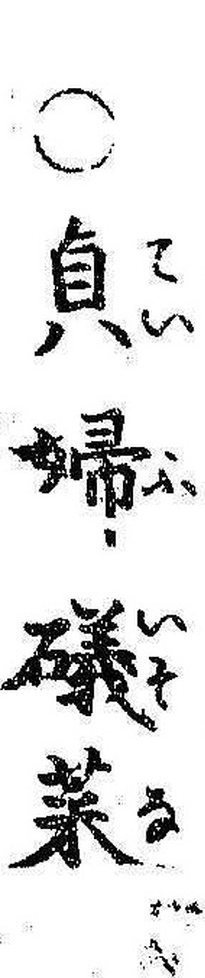○貞婦磯菜
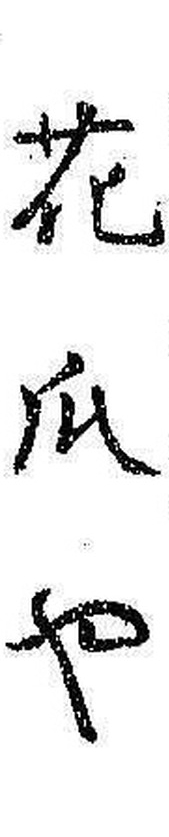花瓜や
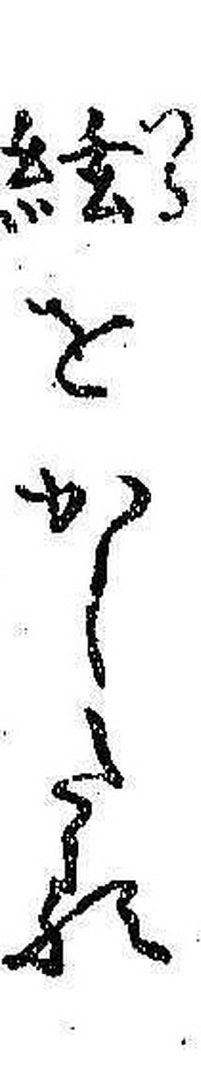絃をかしたる
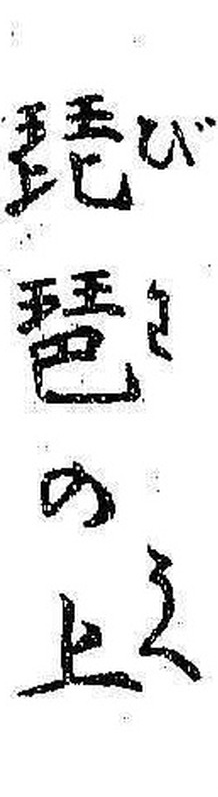琵琶の上
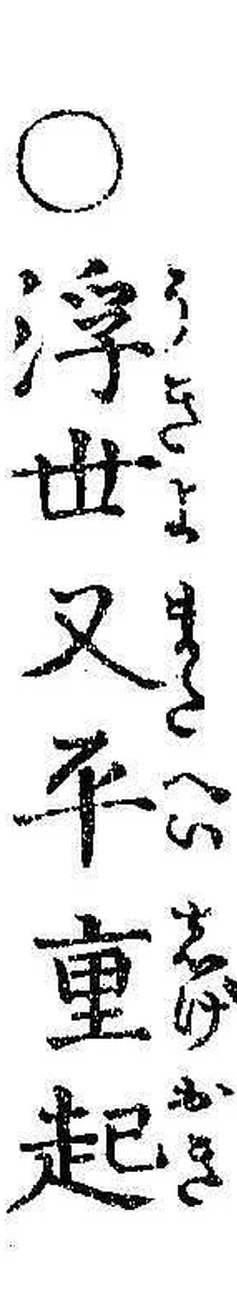○浮世又平重起
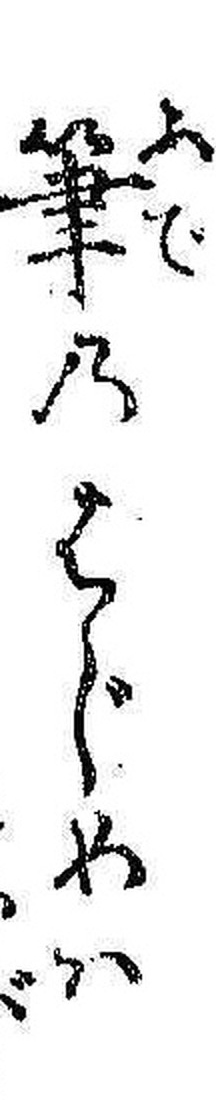筆のはじめは

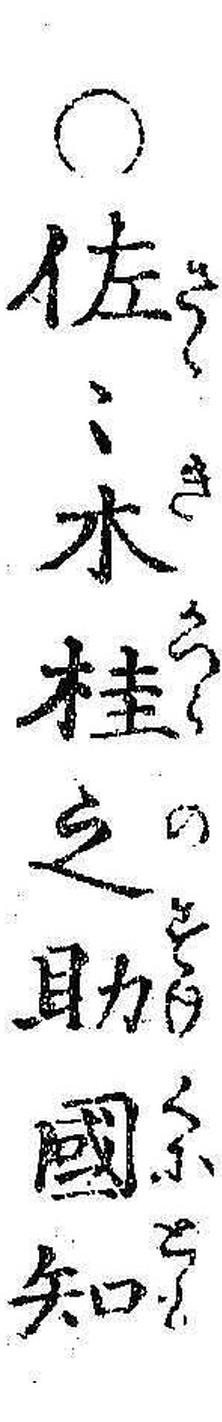○佐々木桂之助国知
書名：昔話稲妻表紙
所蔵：国文学研究資料館
